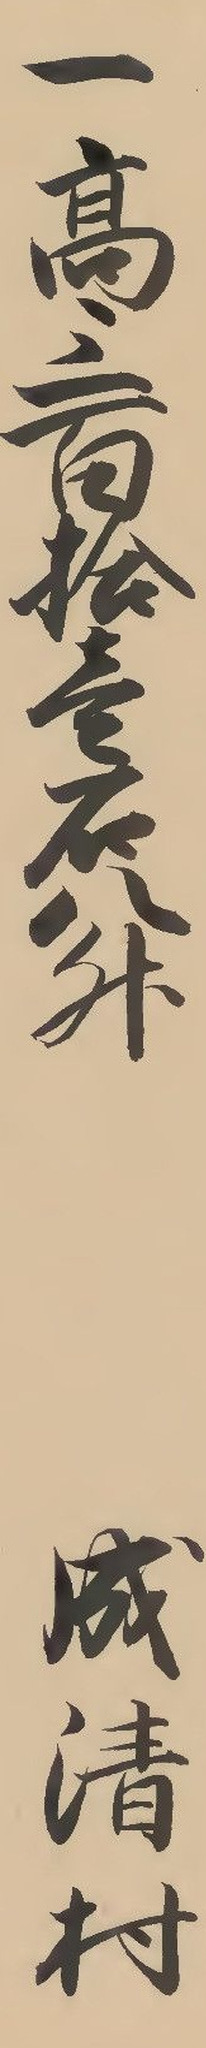一高三百拾壱石八升成清村
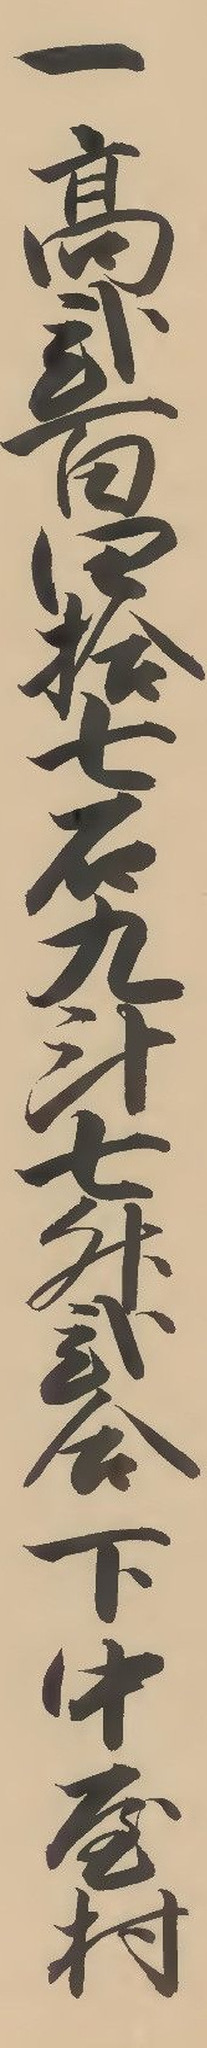一高弐百四拾七石九斗七升弐合下中屋村
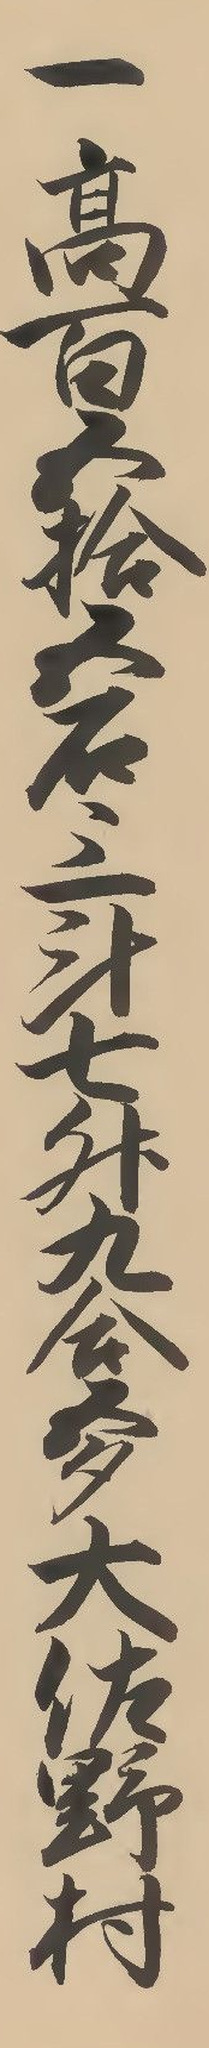一高百五拾五石三斗七升九合五勺大佐野村

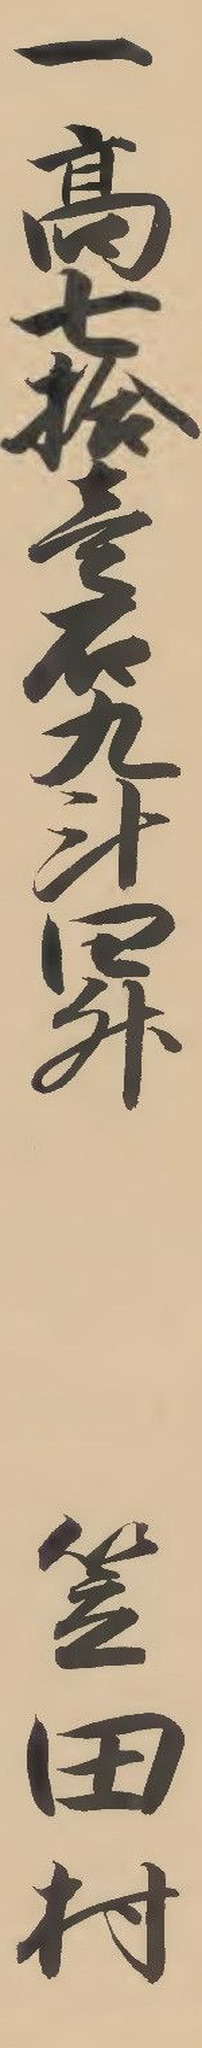一高七拾壱石九斗四升笠田村
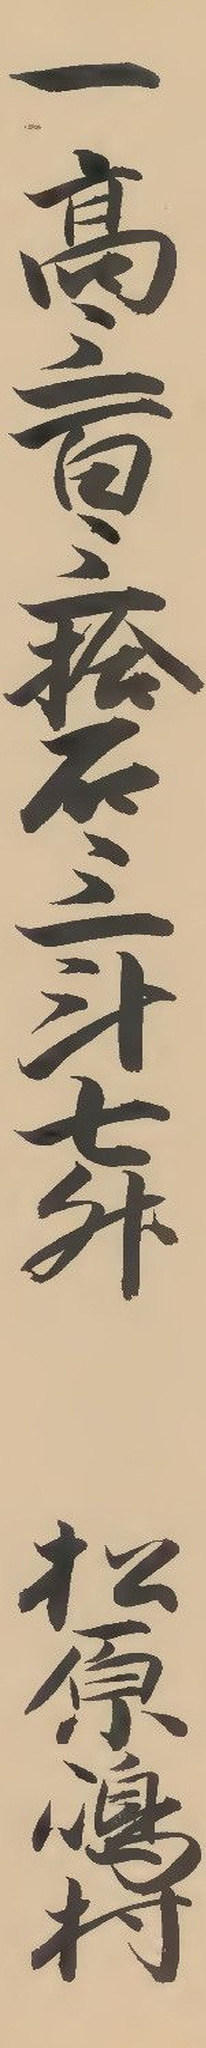一高三百三拾石三斗七升松原島村
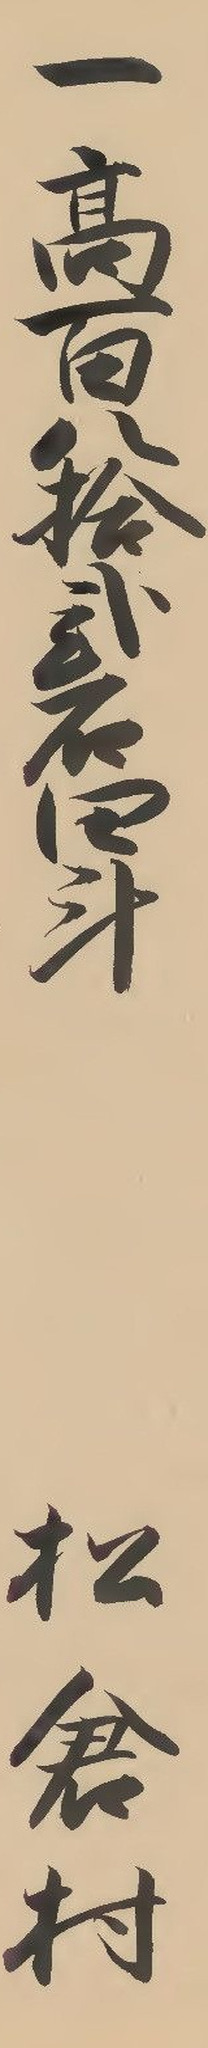一高百八拾弐石四斗松倉村
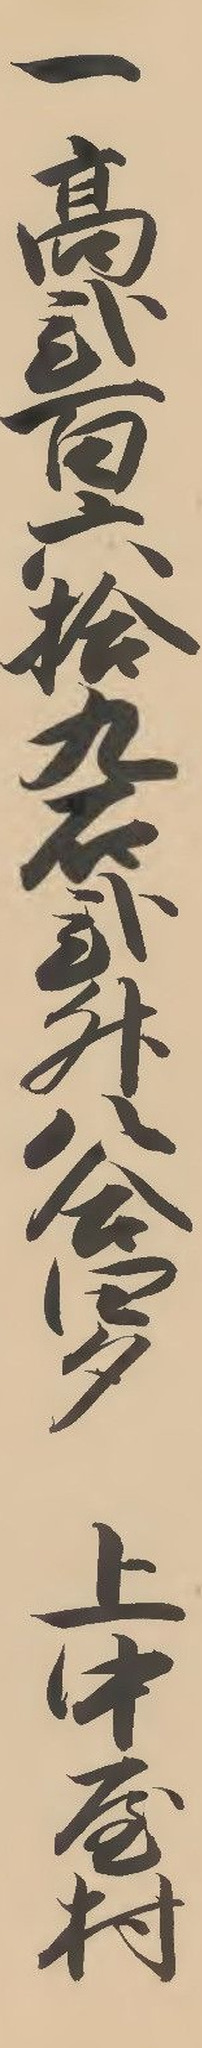一高弐百六拾九石弐升八合四勺上中屋村
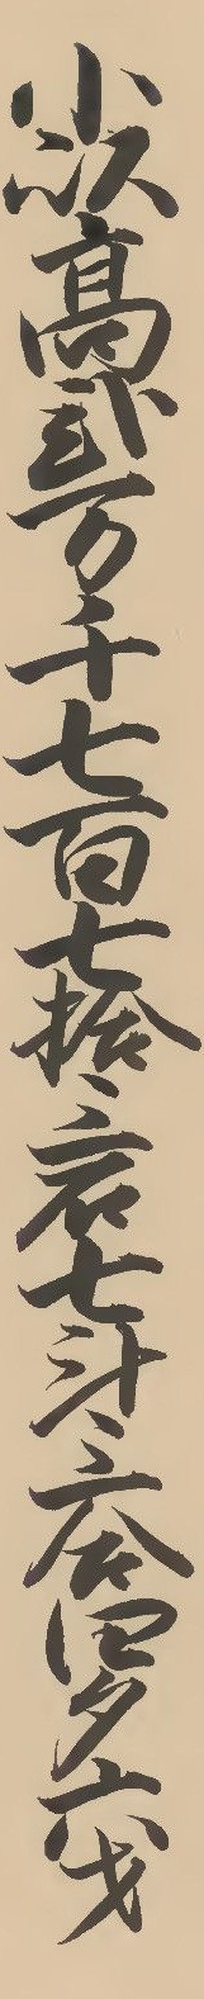小以高弐万千七百七拾三石七斗三合四勺六才

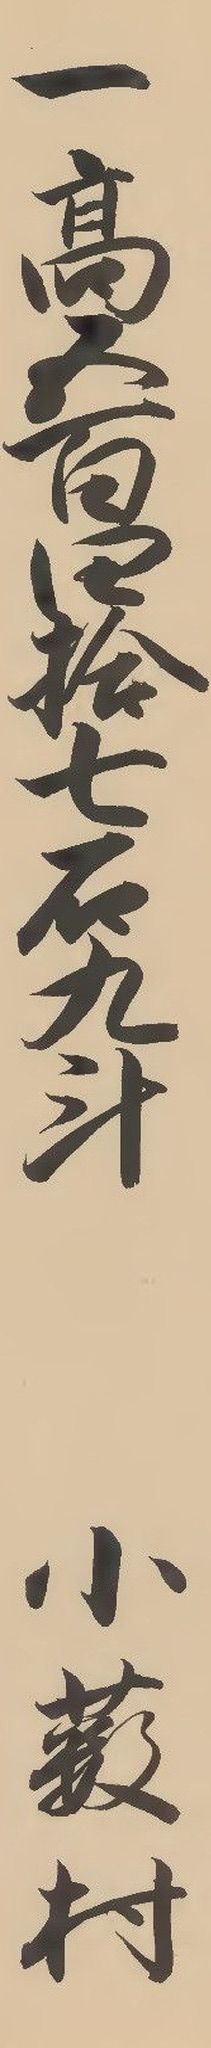一高五百四拾七石九斗小薮村
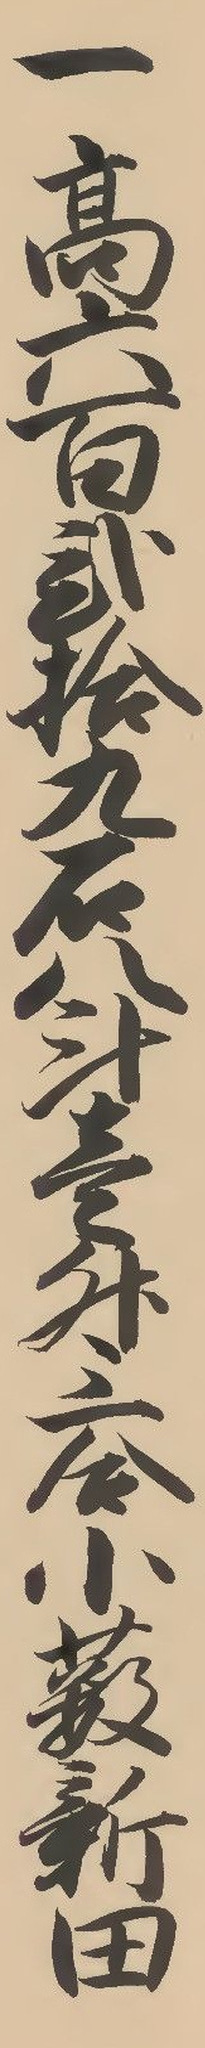一高六百弐拾九石八斗壱升三合小薮新田
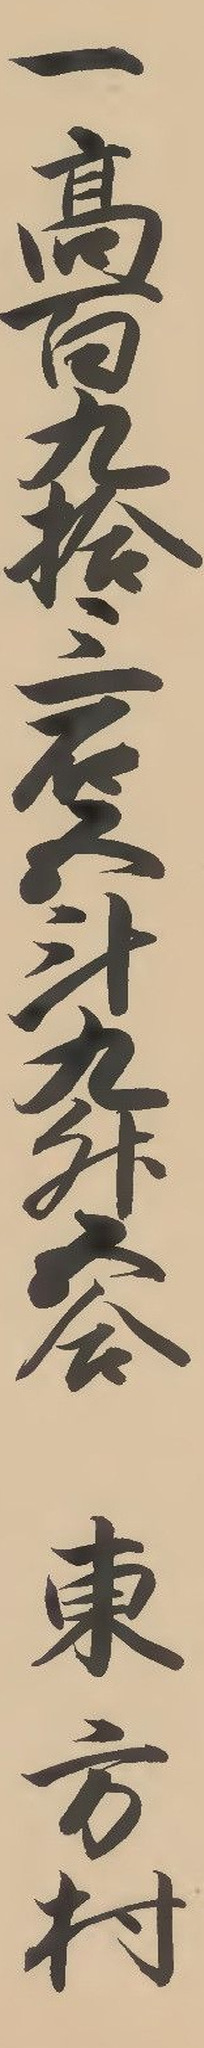一高百九拾三石五斗九升五合東方村
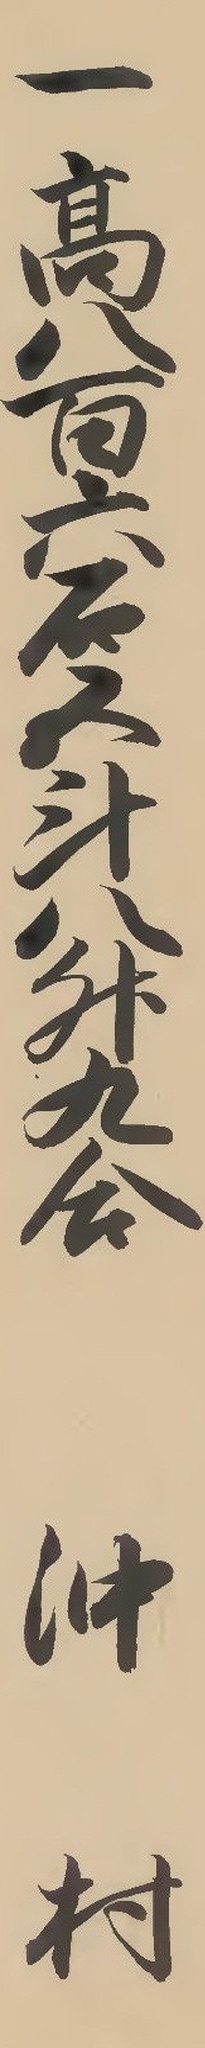一高八百六石五斗八升九合沖村
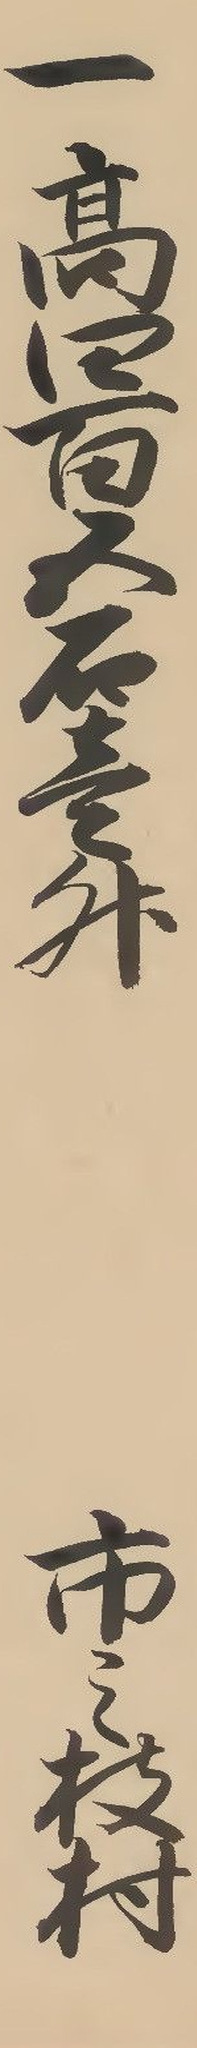一高四百五石壱升市之枝村

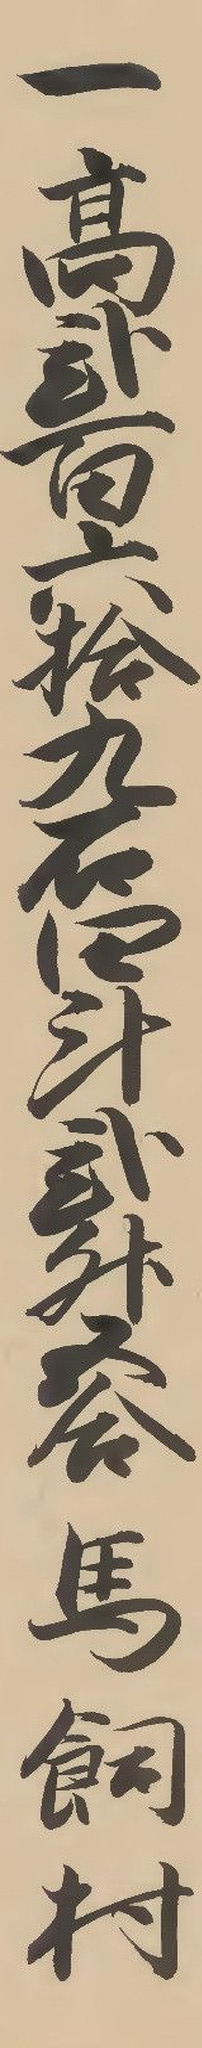一高弐百六拾九石四斗弐升五合馬飼村
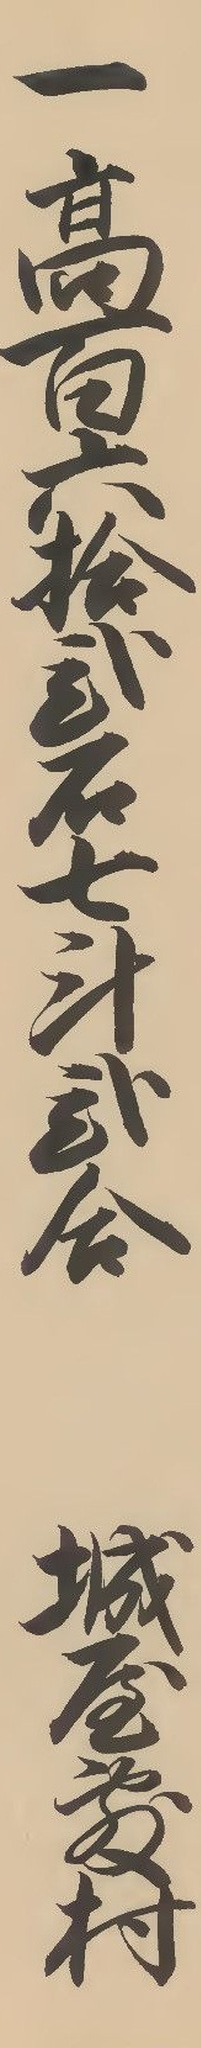一高百六拾弐石七斗弐合城屋敷村
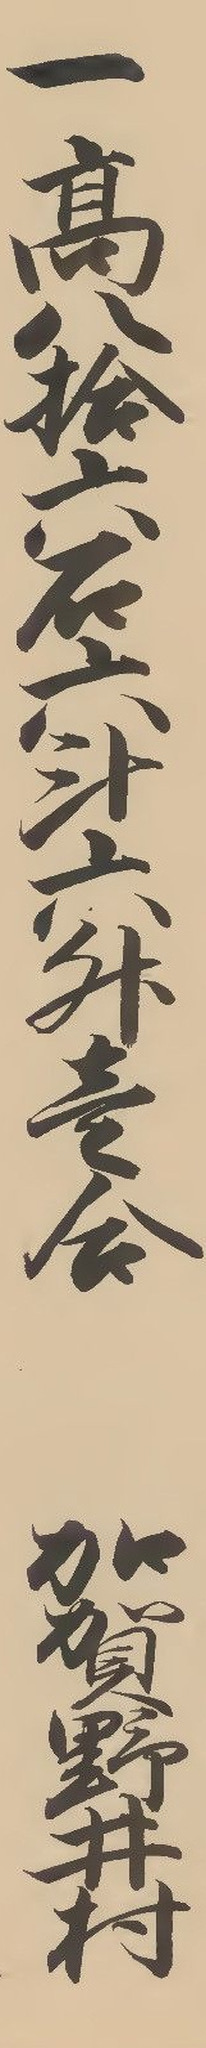一高八拾六石六斗六升壱合加賀野井村
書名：美濃国郷帳
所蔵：国立公文書館 National Archives of Japan
